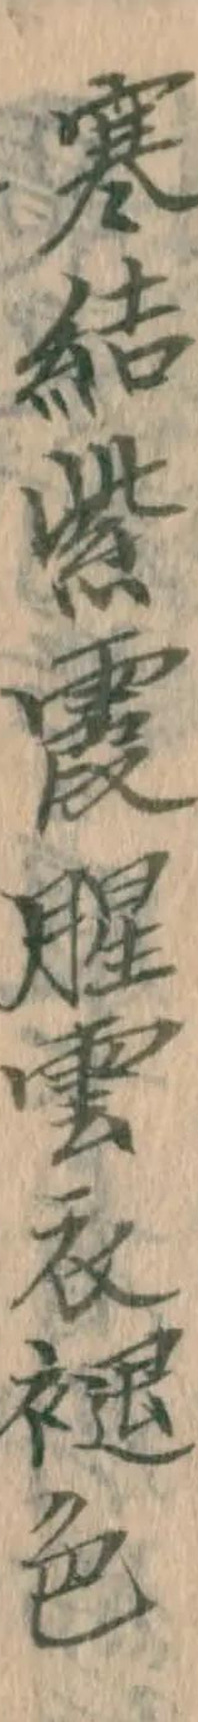寒結紫霞腥雲衣褪色
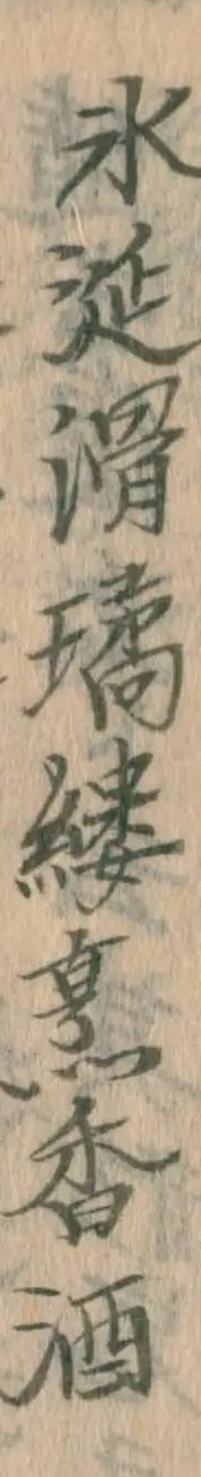氷涎滑璚縷烹香酒
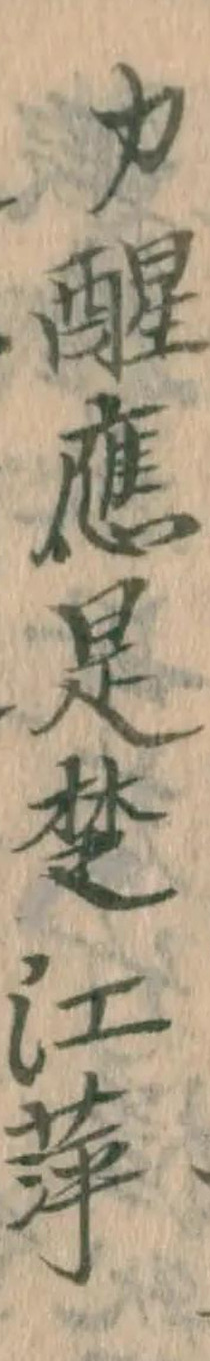力醒應是楚江萍
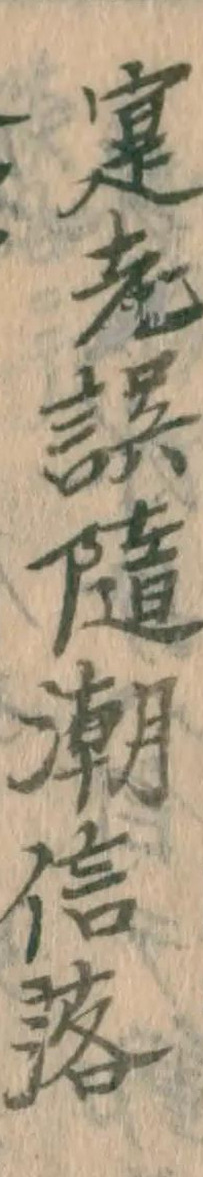寔老誤隨潮信落

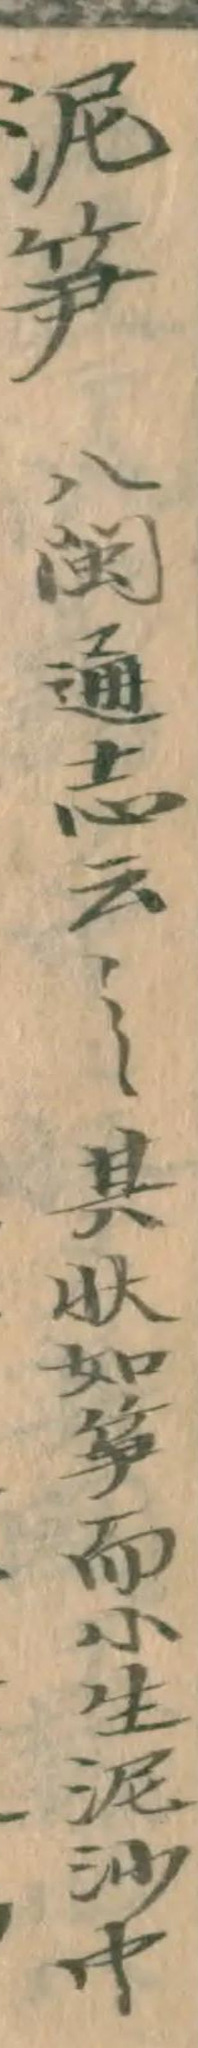泥笋八閩通志云之其状如笋而小生泥沙中
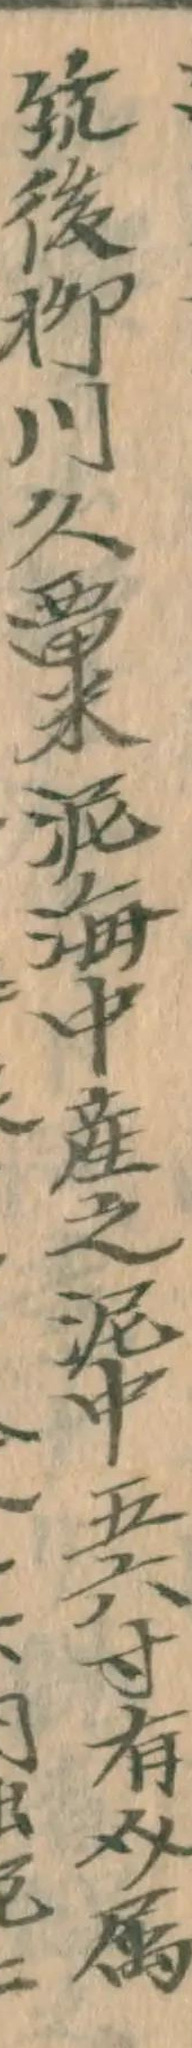筑後柳川久畱米泥海中産之泥中五六寸有介属
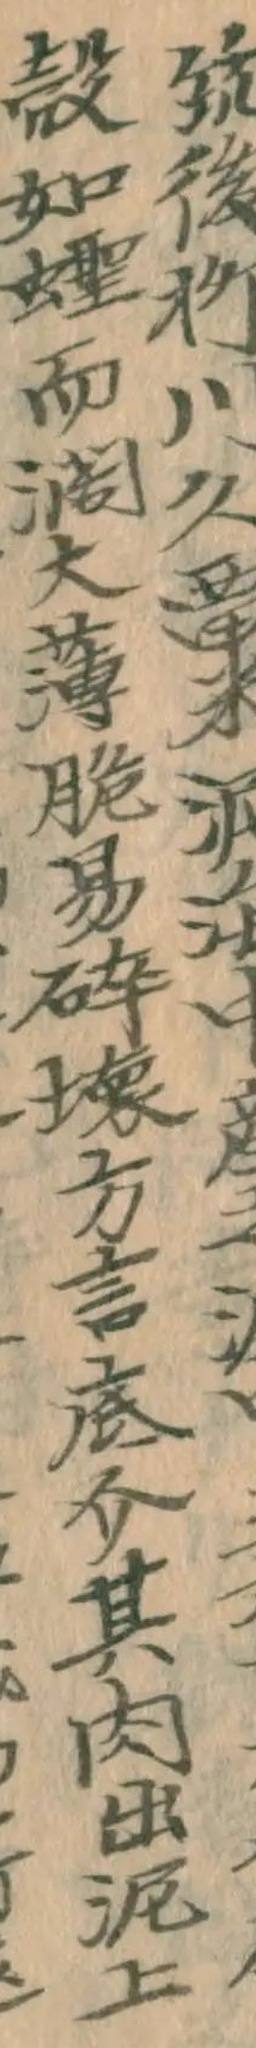殻如蟶而濶大薄脆易碎壊方言底介其肉出泥上
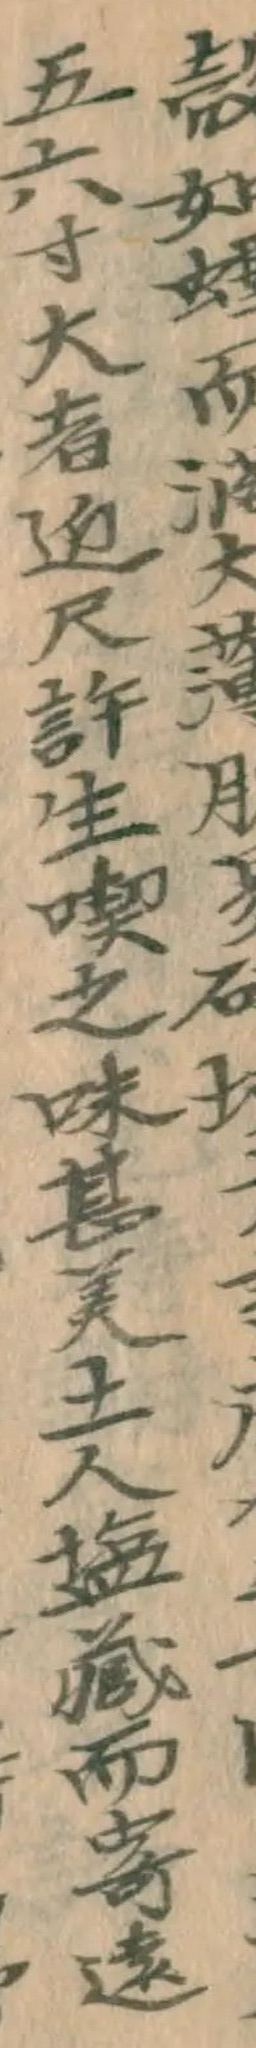五六寸大者近尺許生喫之味甚美土人塩蔵而寄遠
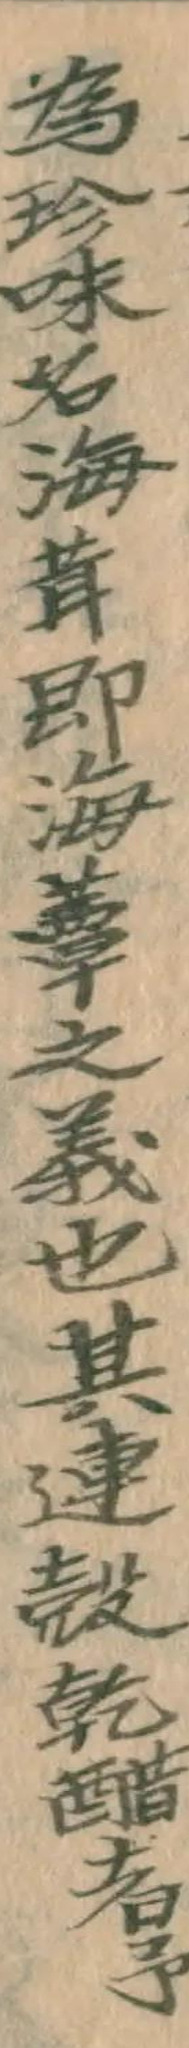為珍味名海茸即海蕈之義也其連殻乾醋者予
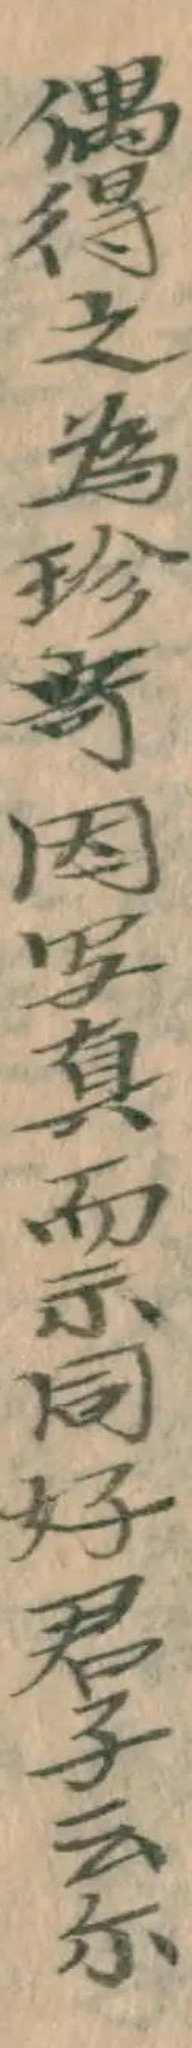偶得之為珍奇因写真而示同好君子云尓
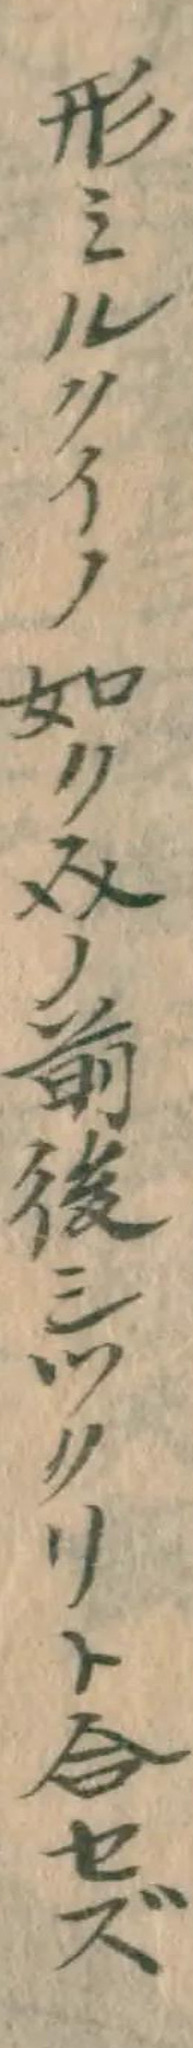形ミルクイノ如ク介ノ前後シツクリト合セズ
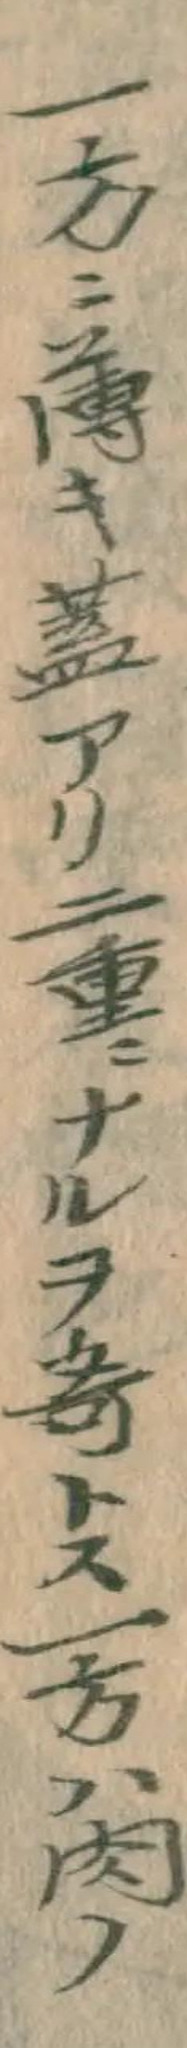一方ニ薄キ蓋アリ二重ニナルヲ奇トス一方ハ肉ノ
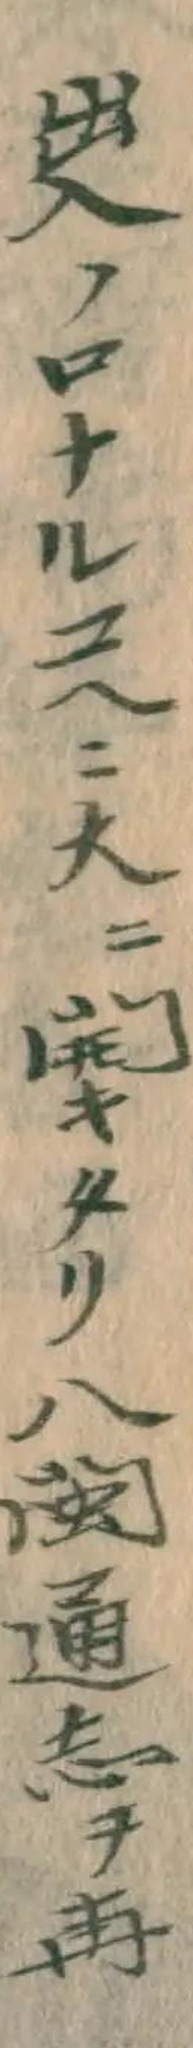出入ノ口ナルユヘニ大ニ開キタリ八閩通志ヲ再
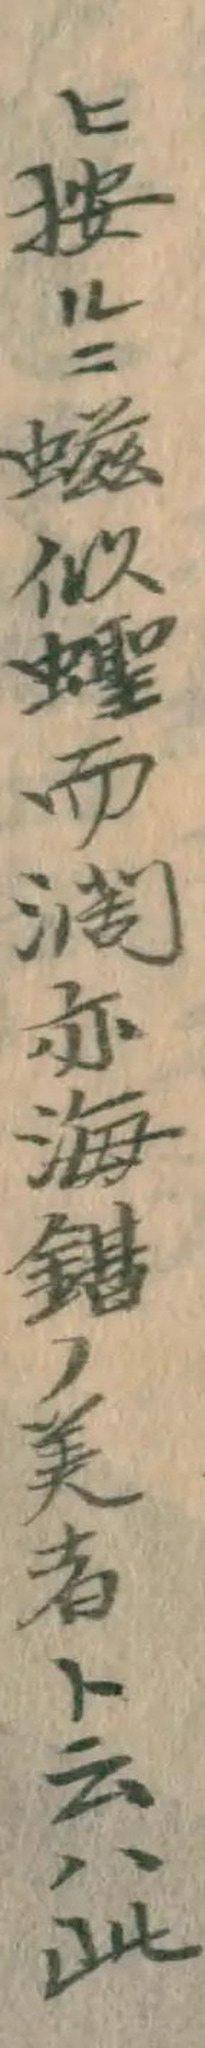ヒ按ルニ螆似蟶而濶亦海錯ノ美者ト云ハ此
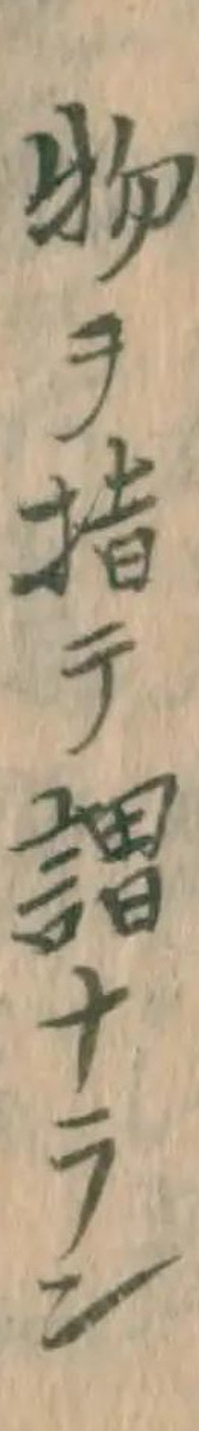物ヲ指テ謂ナラン
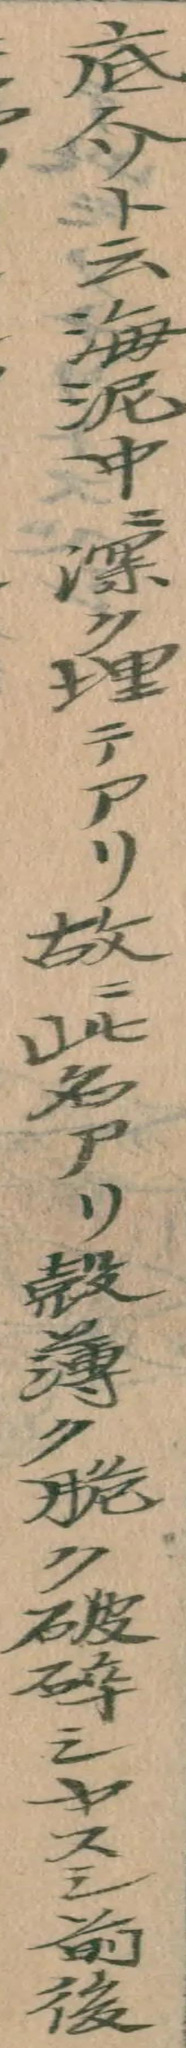底介ト云海泥中ニ深ク埋テアリ故ニ此名アリ殻薄ク脆ク破碎シヤスシ前後
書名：千蟲譜 3巻. [1]
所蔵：国立国会図書館 National Diet Library, JAPAN
